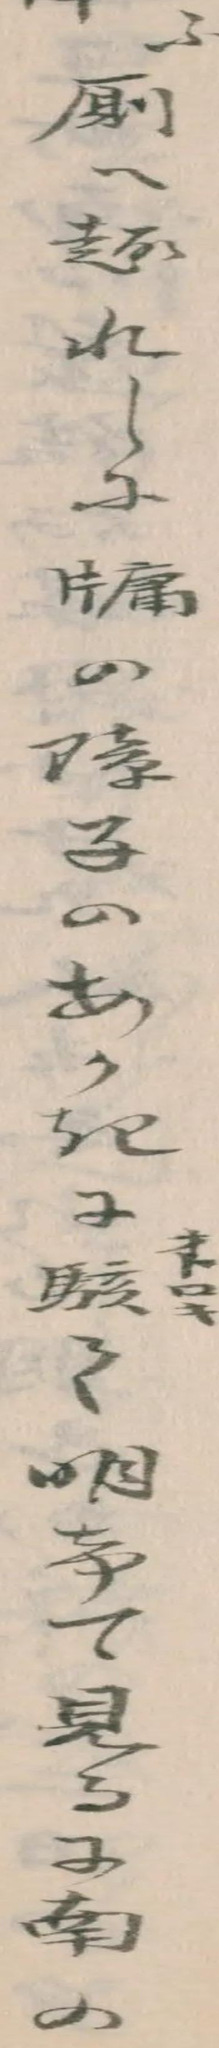か不詳厠へ趣れしに牖の障子のあかきに駭て明けて見るに南の
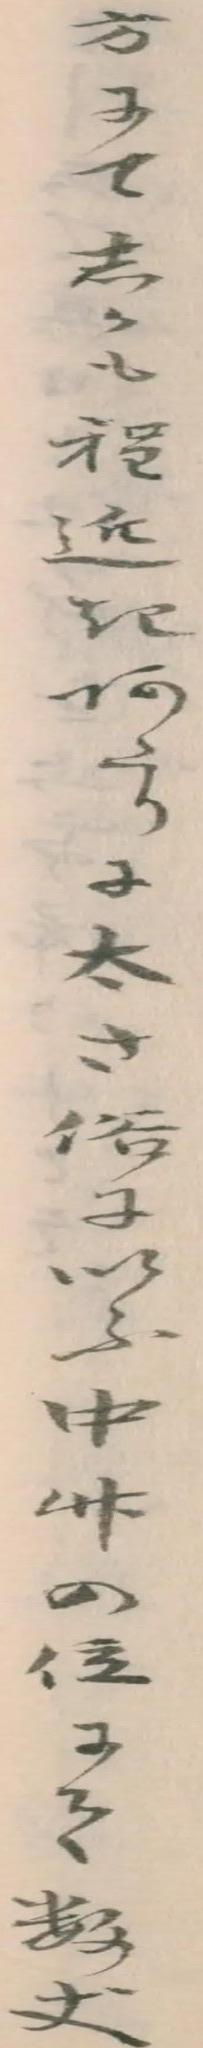方にてしかも程近きあたりに太さ俗にいふ中竹の位にて数丈
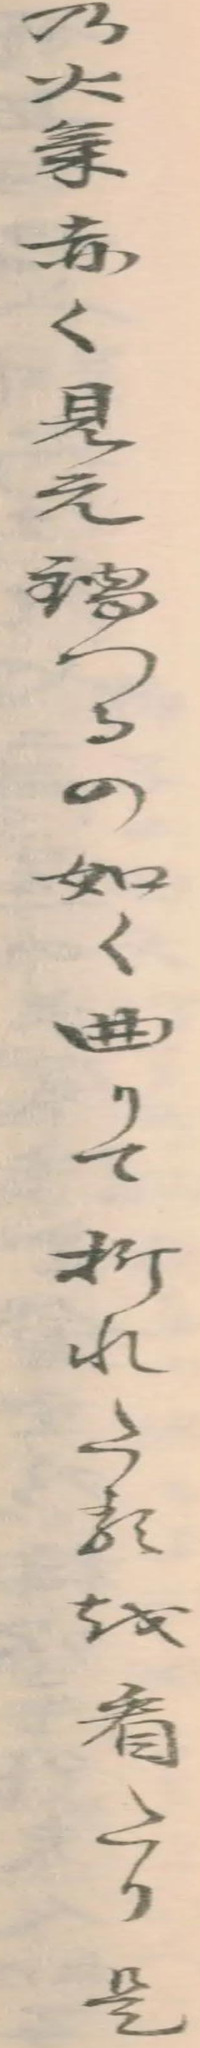の火気赤く見え鍋つるの如く曲りて折れたるを看たり是
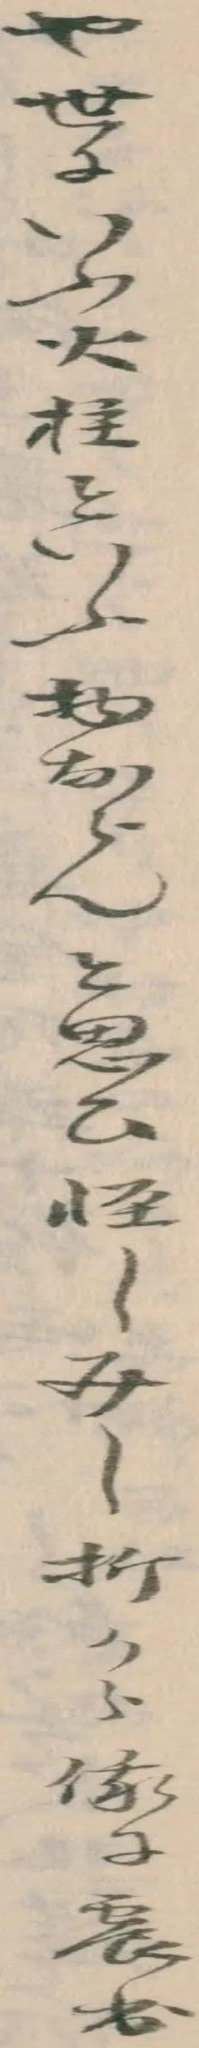や世にいふ火柱といふ物ならんと思ひ怪しみし折から俄に震出
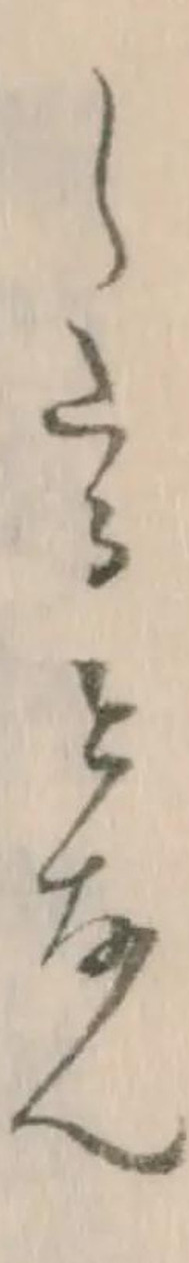したるとなん
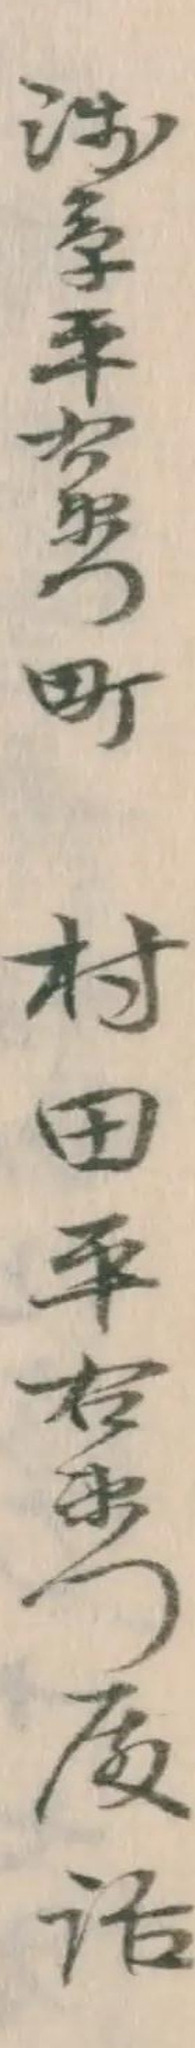浅草平右衛門町村田平右衛門殿話
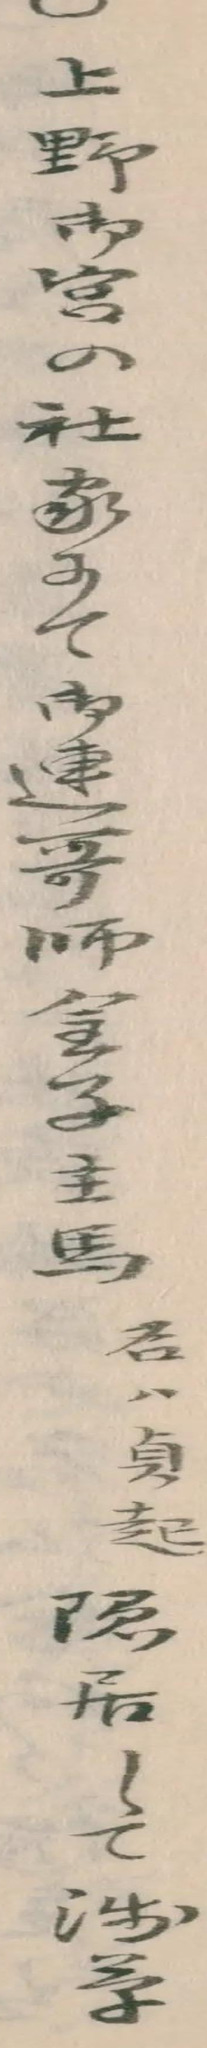〇上野御宮の社家にて御連哥師金子主馬名ハ貞起隠居して浅草
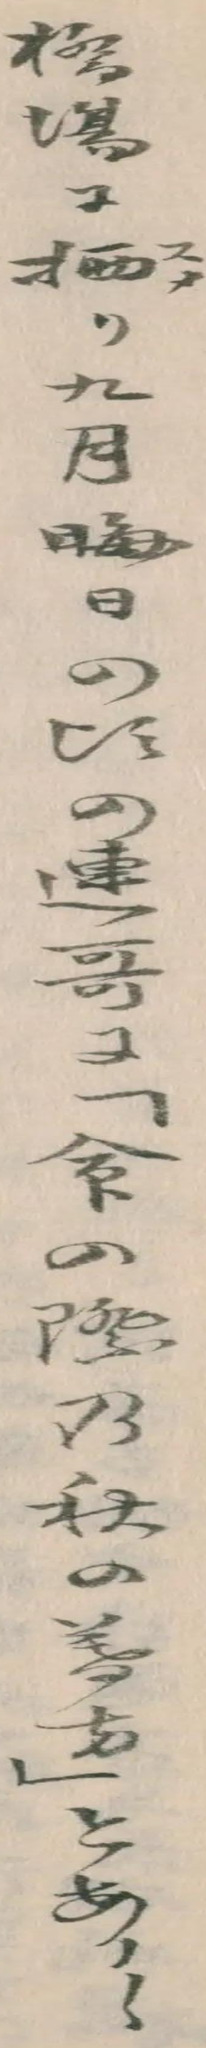橋場に栖り九月晦日の頃の連哥に「命の際の秋の暮方」とありし
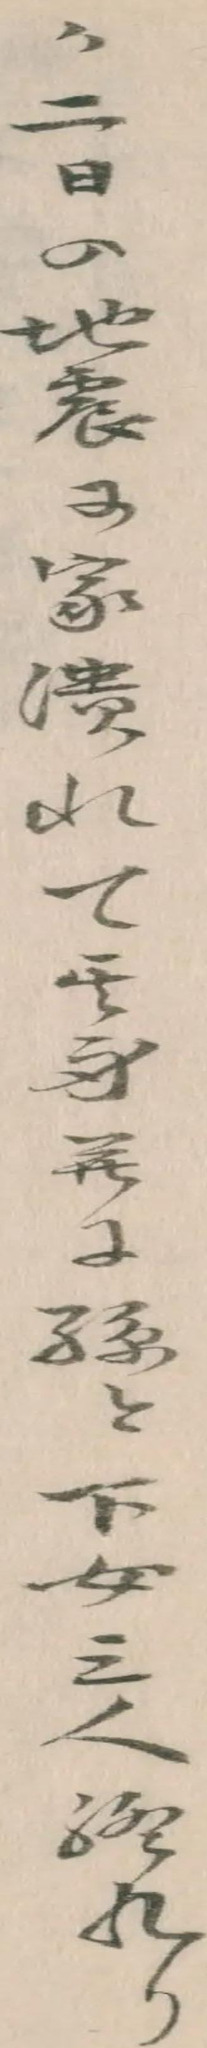か二日の地震に家潰れて其身并に孫と下女三人終れり
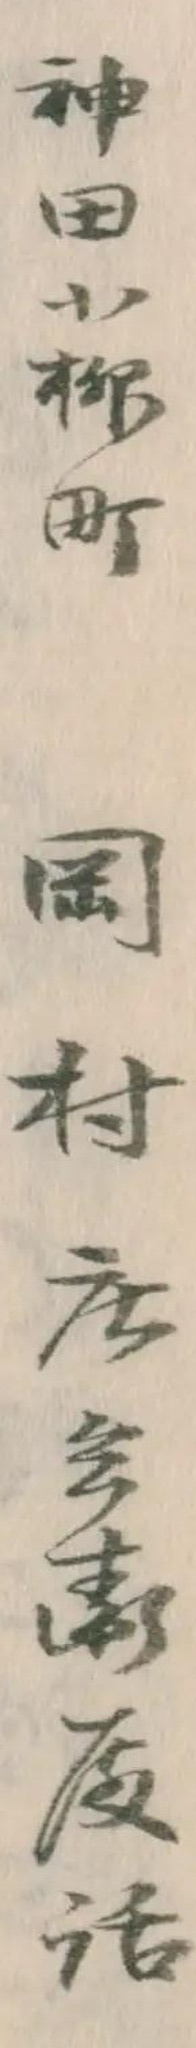神田小柳町岡村庄兵衛殿話
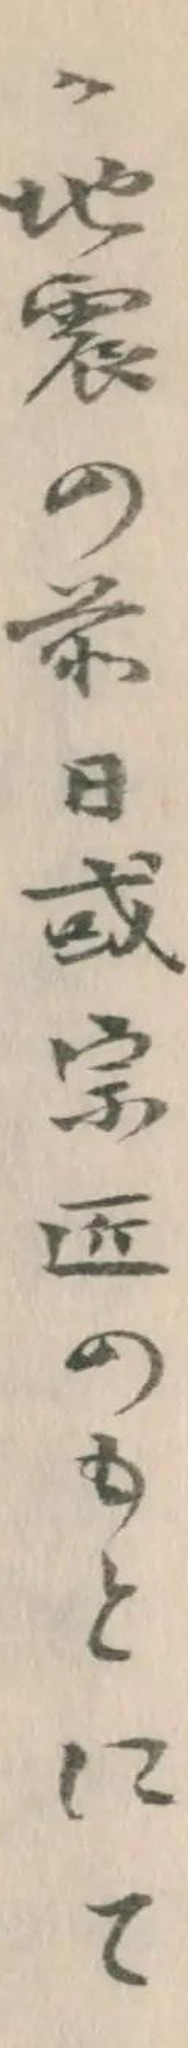か地震の前日或宗匠のもとにて

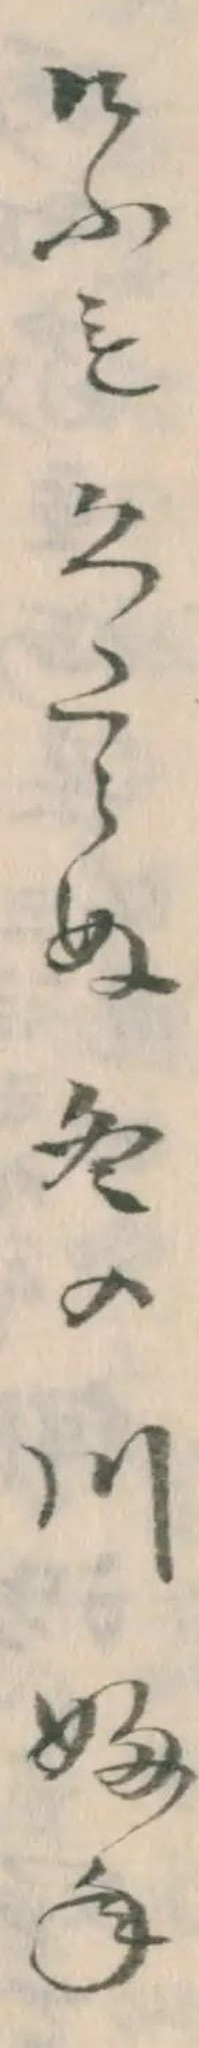けふもくたらぬ冬の川ふね宗匠
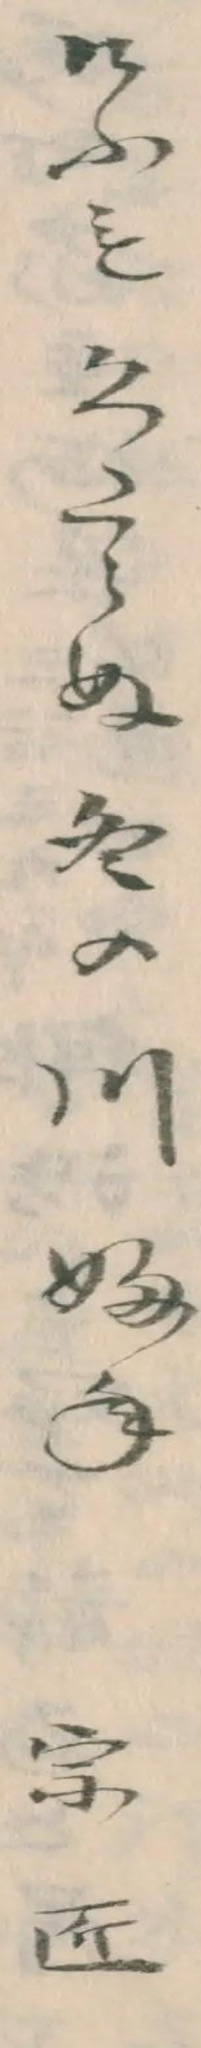けふもくたらぬ冬の川ふね宗匠
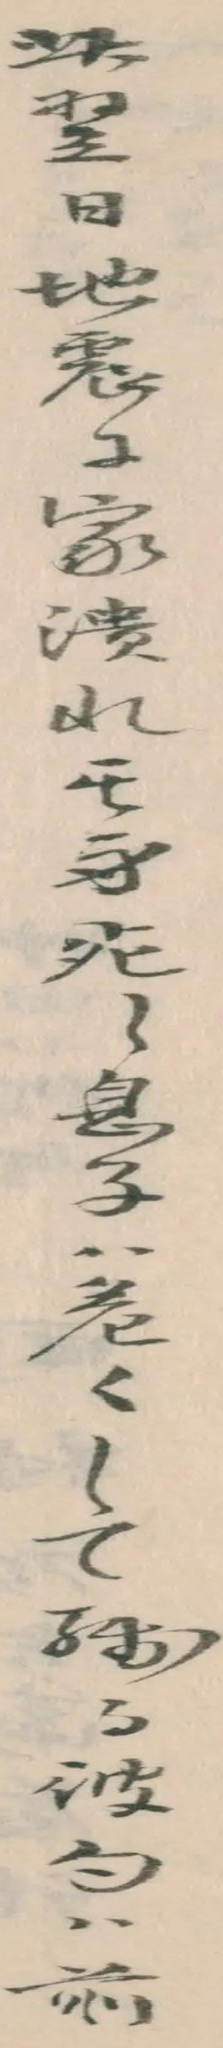此翌日地震に家潰れ其身死し息子は危くして残る彼句は前
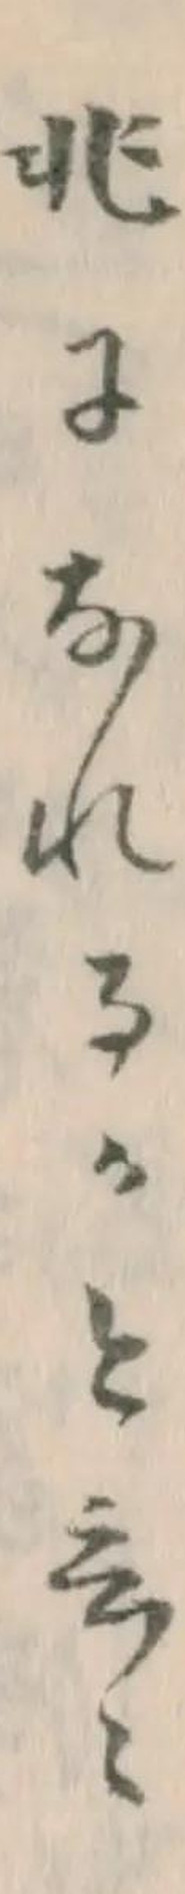兆になれるかと云々
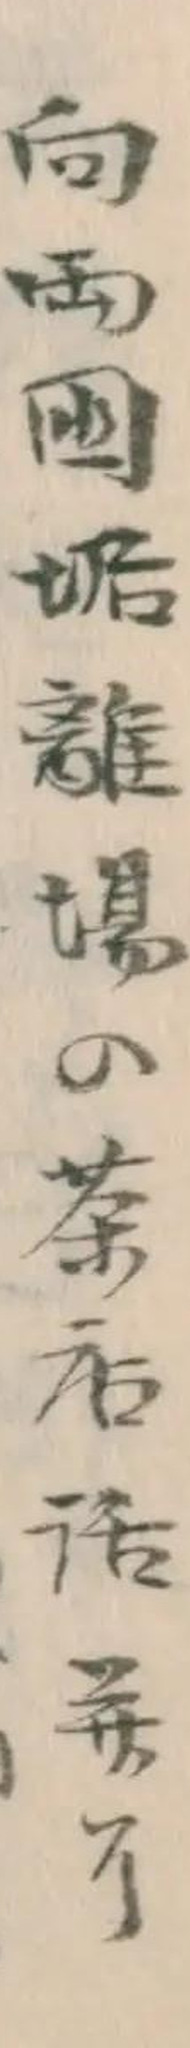向両国垢離場の茶店話并に
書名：地災撮要. 巻7-9(地震之部)
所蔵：国立国会図書館 National Diet Library, JAPAN
